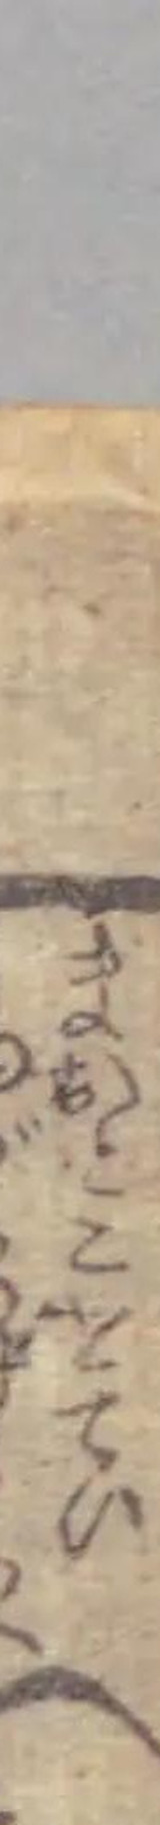まおとこをてい
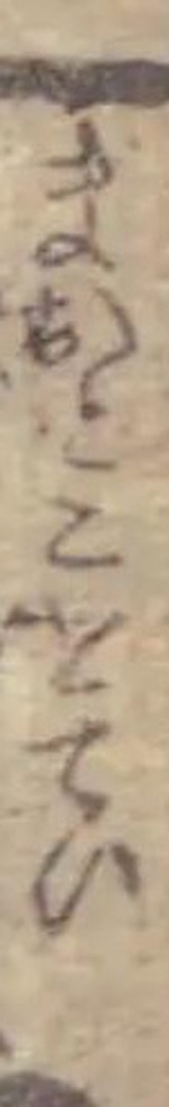まおとこをてい
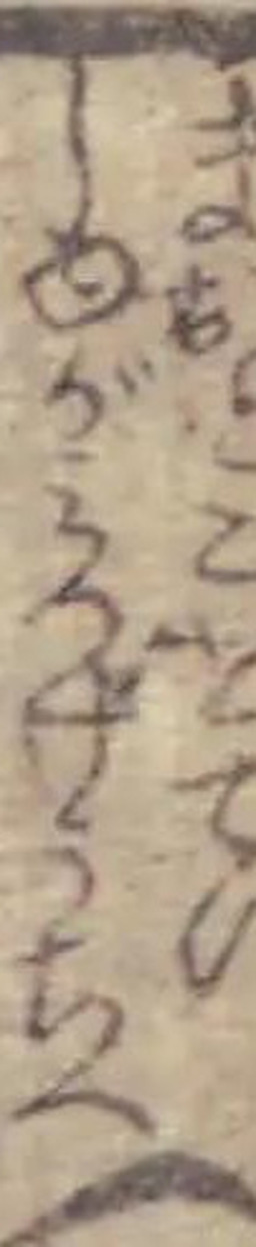しゆがみつけうちへ
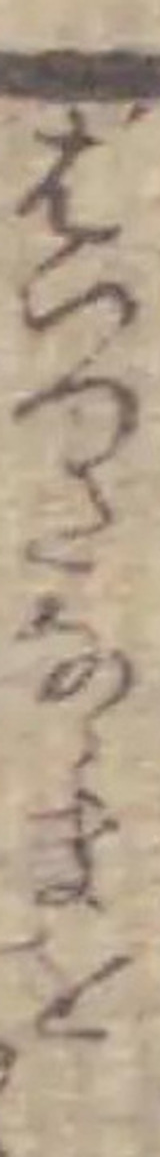はいつたならを
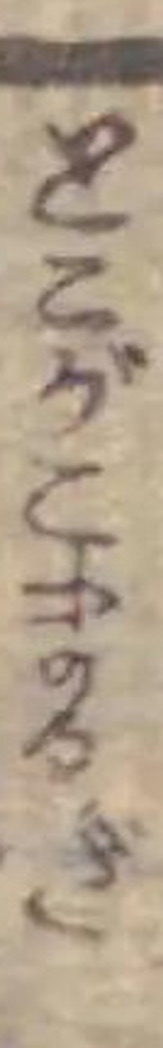とこがこまるだ
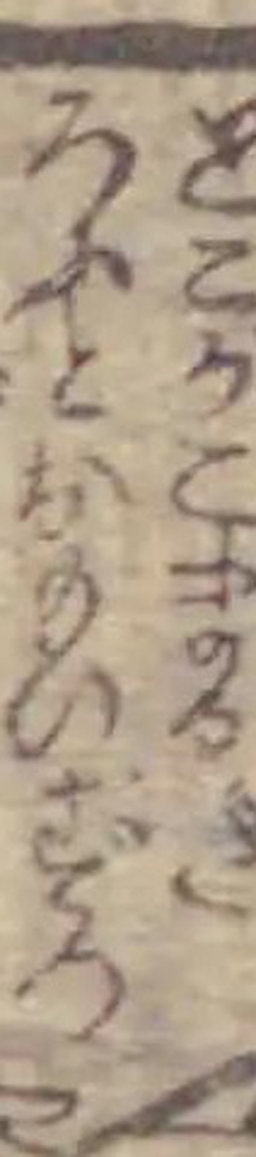ろふとおもいずつ
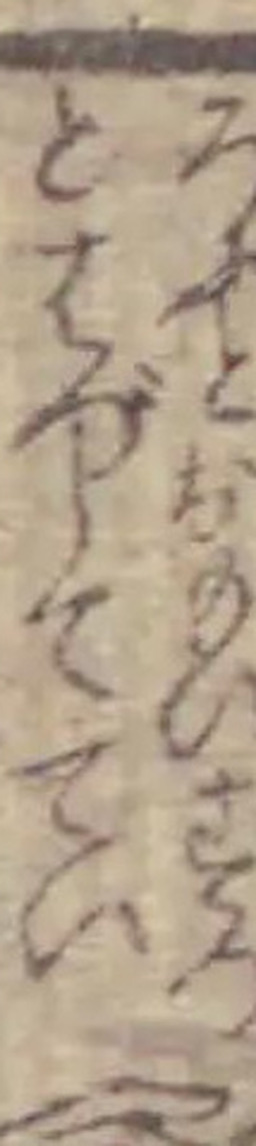とはづしててい
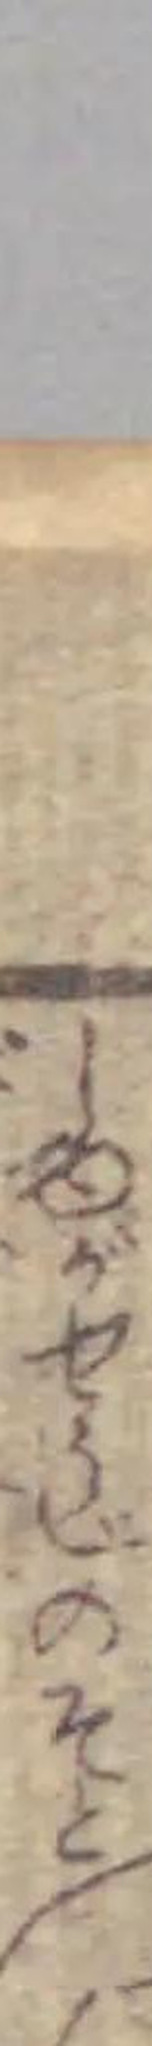しゆがせうじのそと
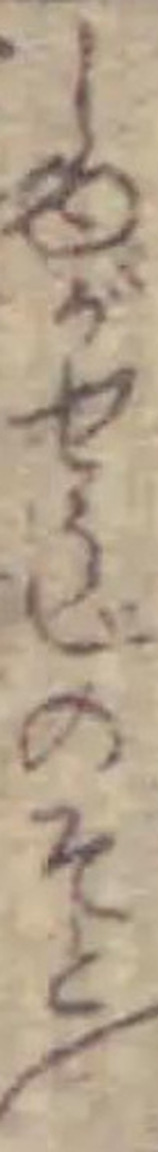しゆがせうじのそと
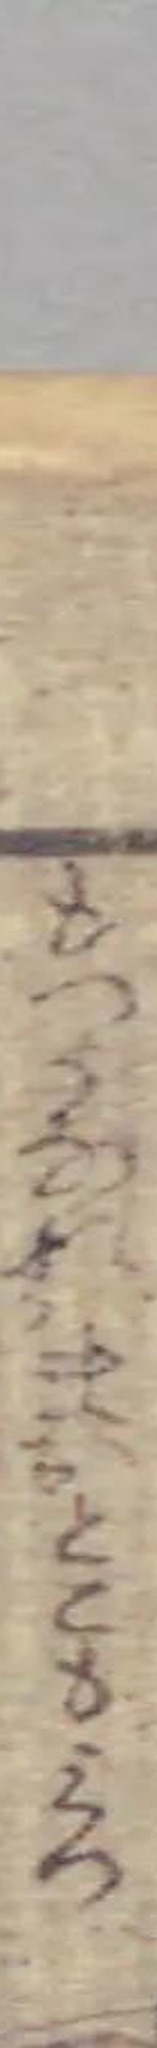もつうなればまおとこもみつ
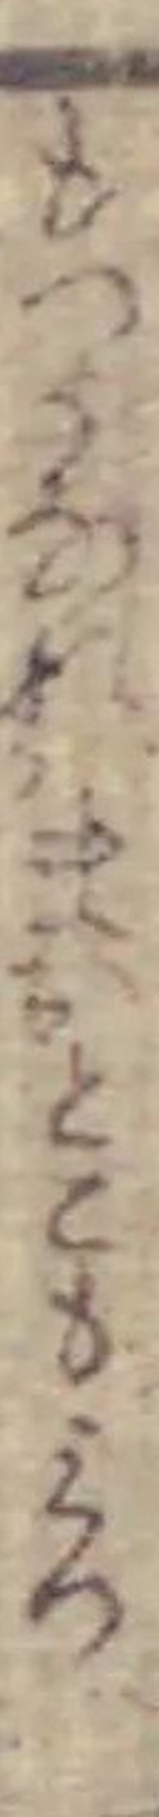もつうなればまおとこもみつ
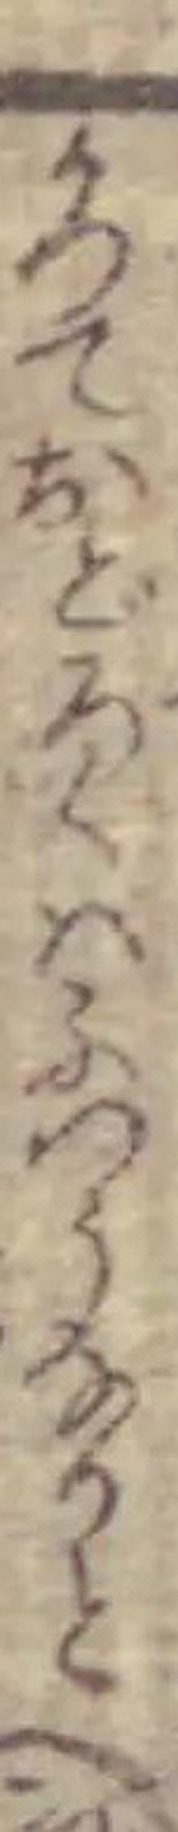かつておどろくはふつうなりと
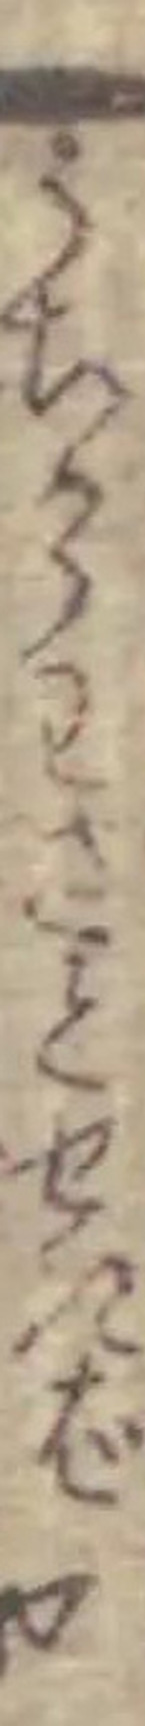うちからわさとせきば
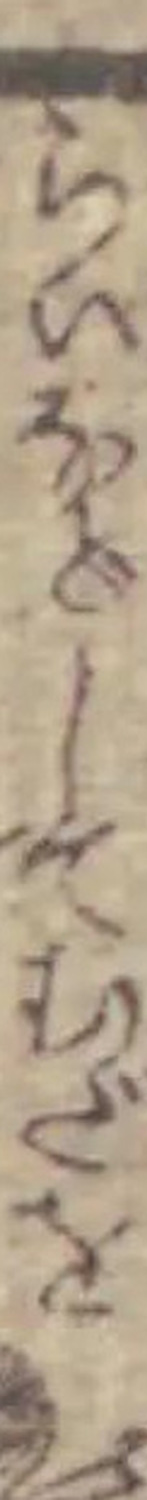らいなどしてむだを
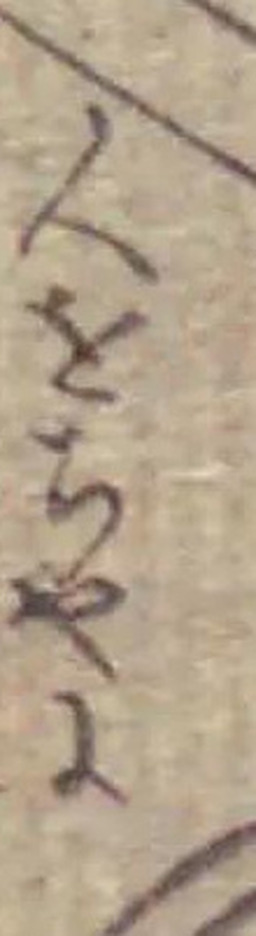人をちやに
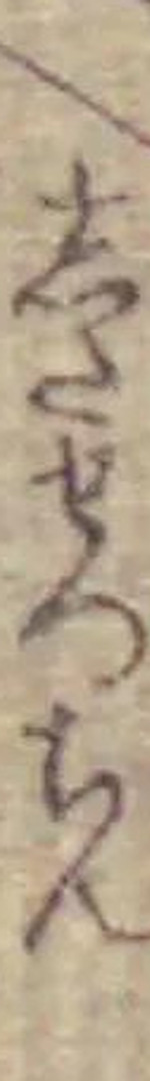したせつちん
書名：茶羅毛通人 3巻
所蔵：国立国会図書館 National Diet Library, JAPAN
